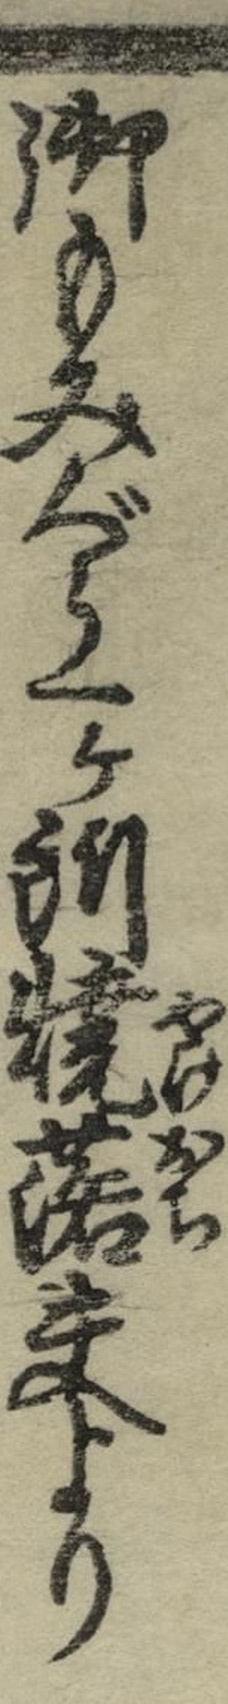御もみぐら一ヶ所焼落夫より
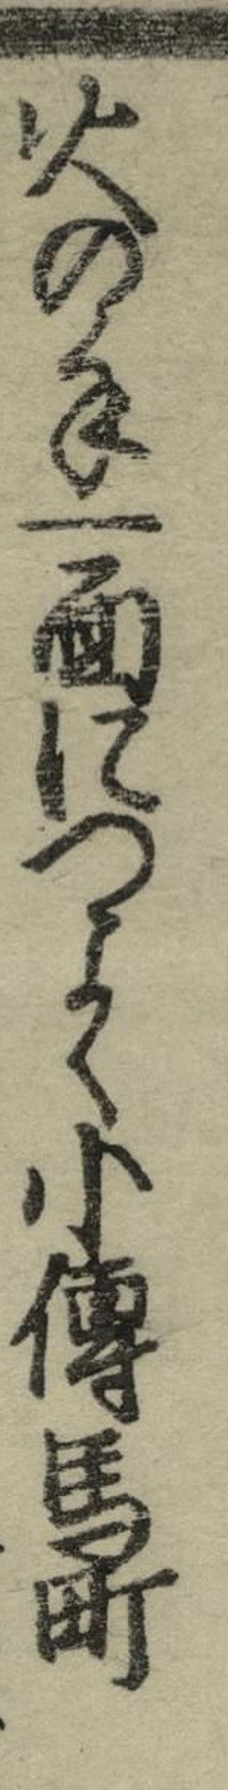火の手一面につよく小伝馬町
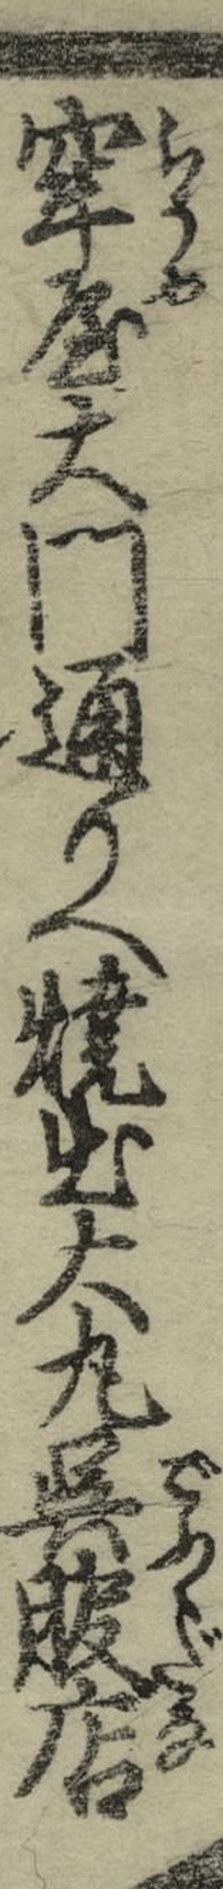牢屋大門通りへ焼出大丸呉服店
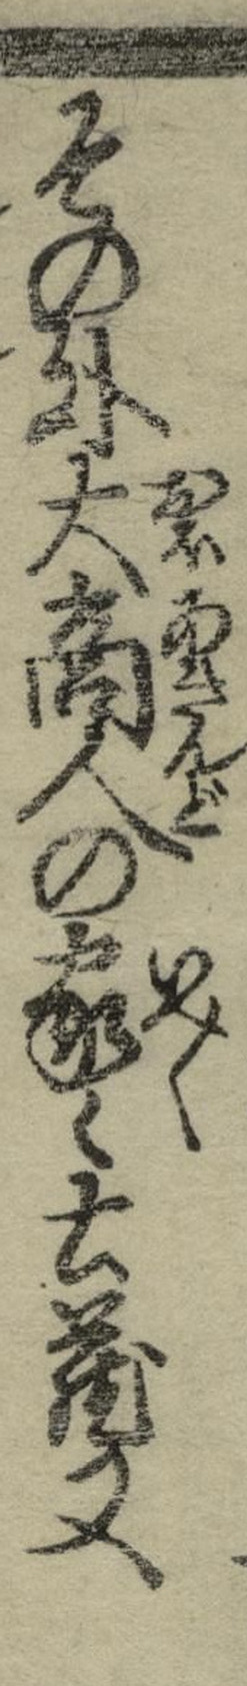その外大商人の家々土蔵又
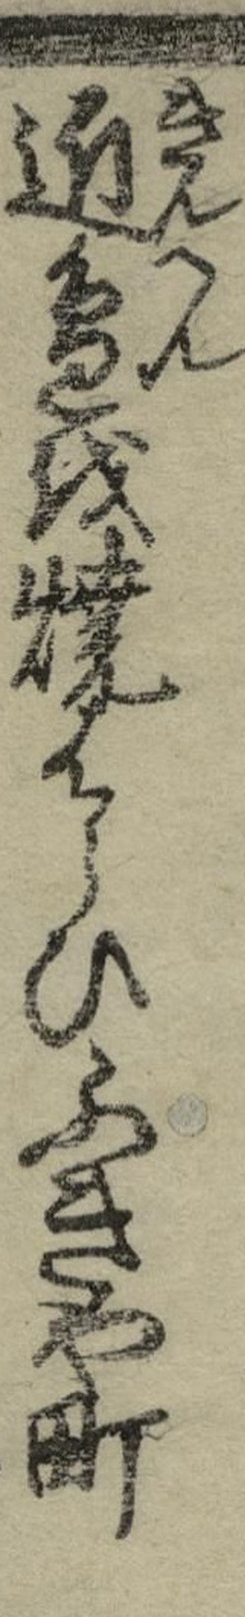近辺を焼はらひふきや町
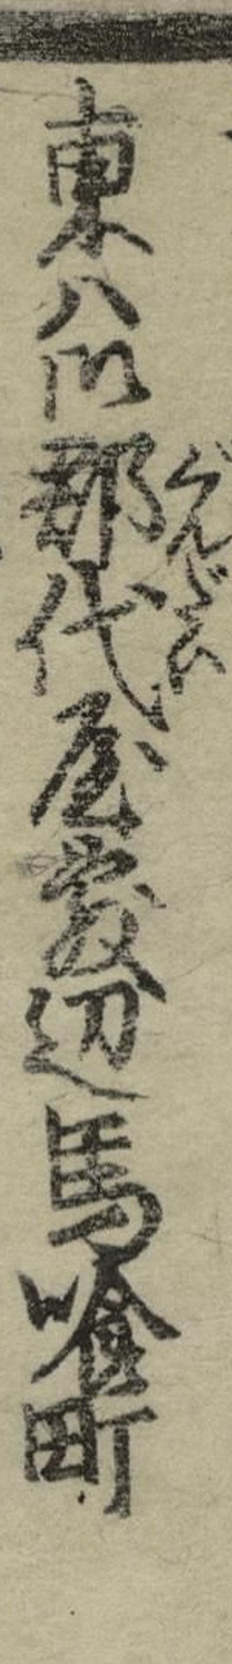東は御郡代屋敷辺馬喰町
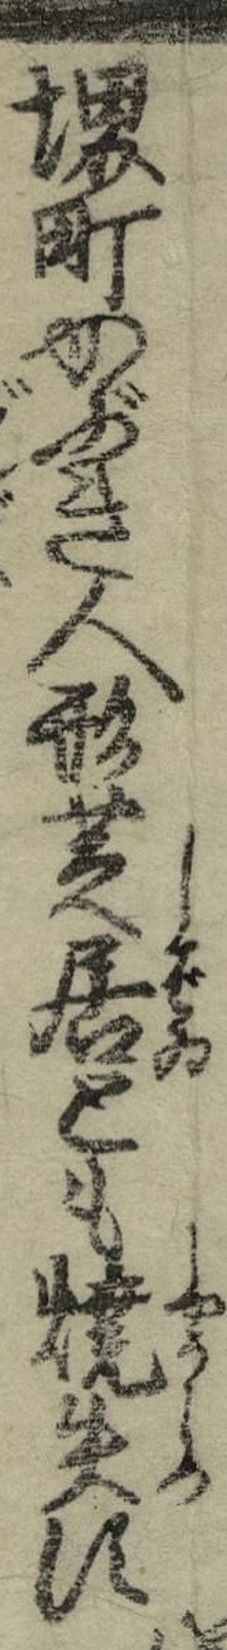堺町かぶき人形芝居とも焼失す
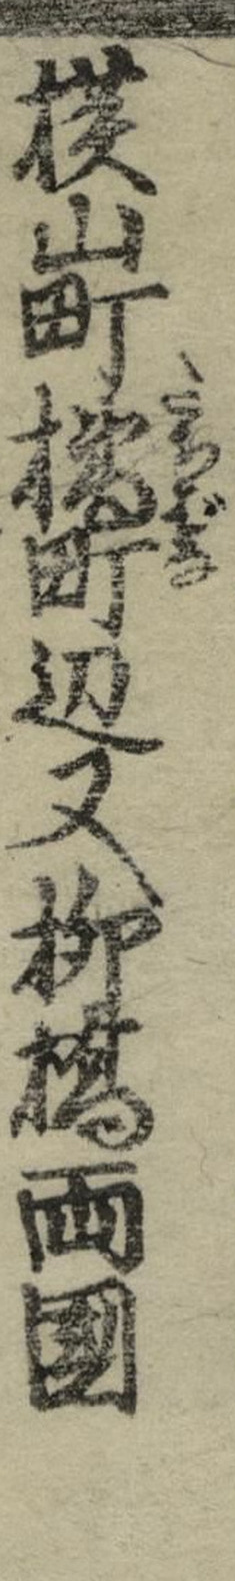横山町橘町辺又柳橋両国
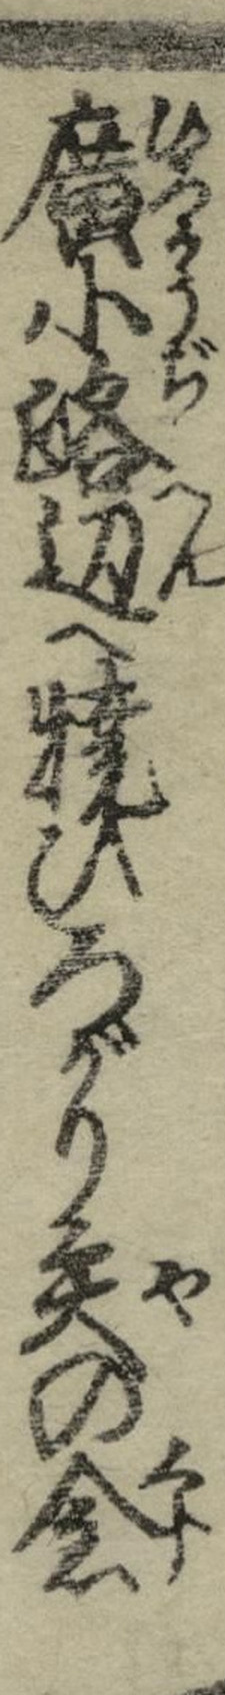広小路辺へ焼ひろがり矢の倉
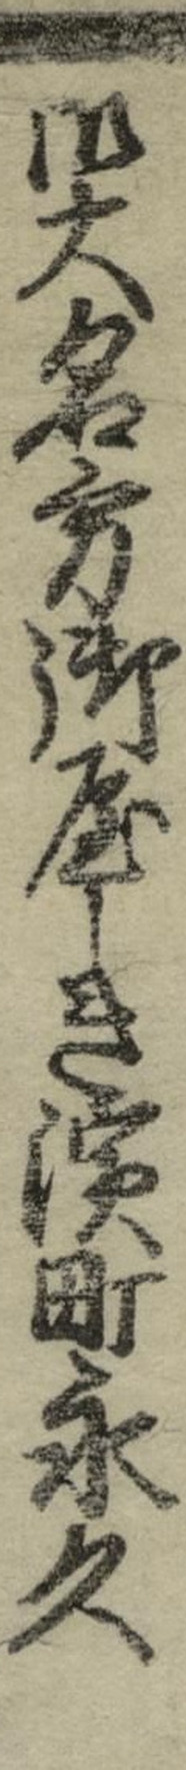御大名方御屋しき浜町永久
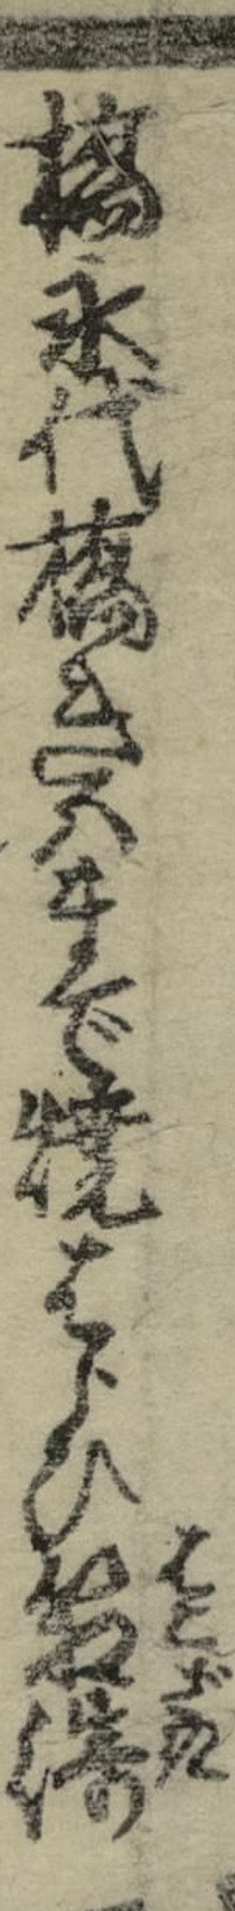橋永代橋きはまで焼はらひ箱崎
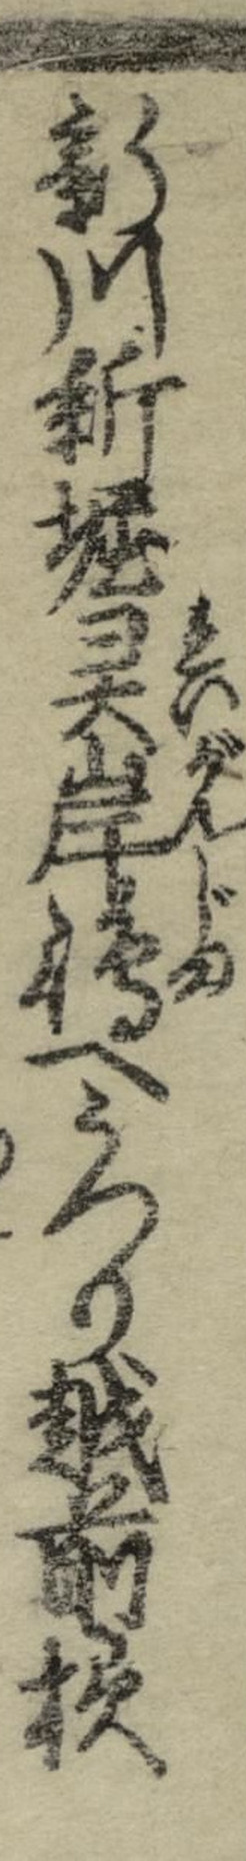新川新堀霊岸嶋へうつり越前様
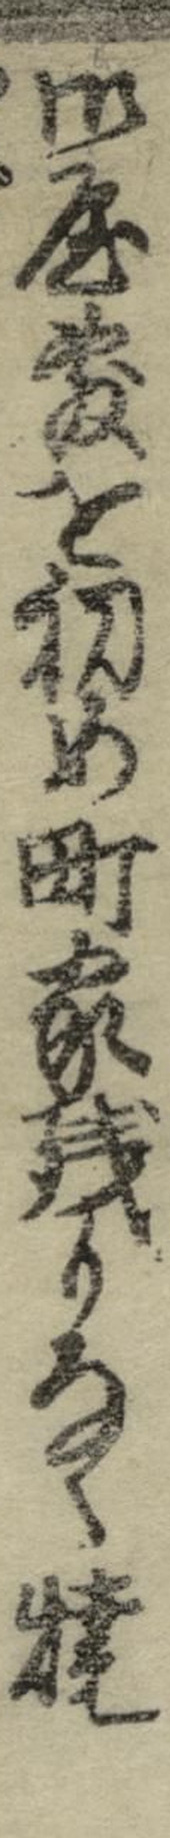御屋敷を初め町家残りなく焼
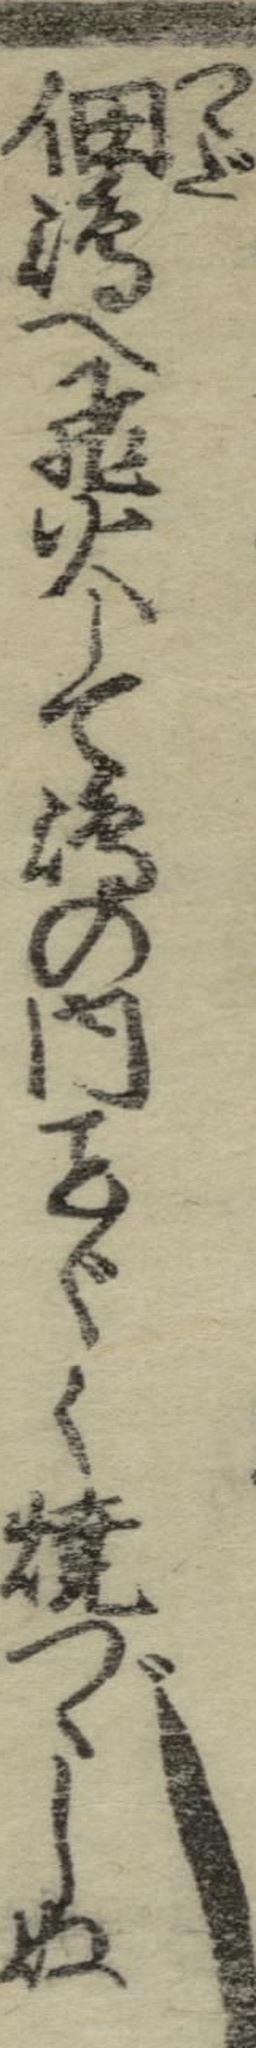佃嶋へ飛火して嶋の内こと〴〵く焼つくしぬ
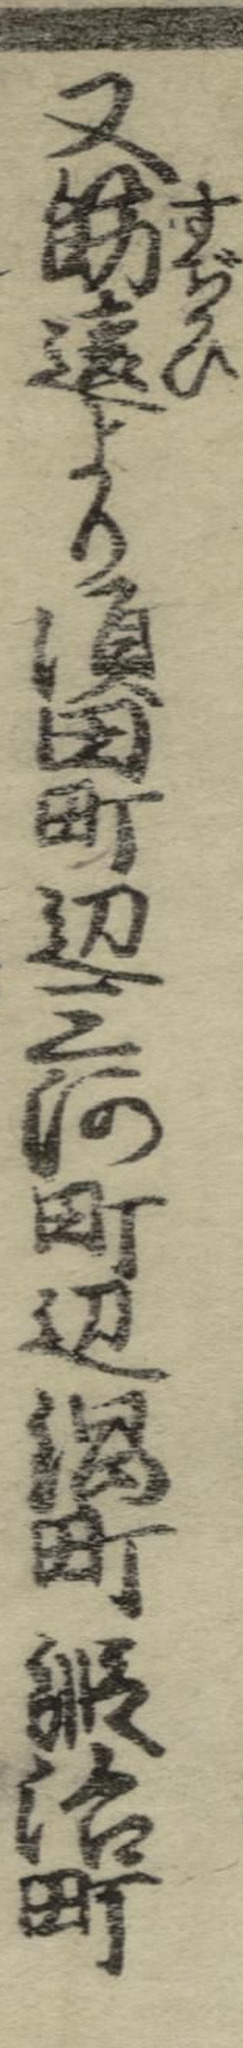又筋違より須田町辺三河町辺鍋丁鍛冶町
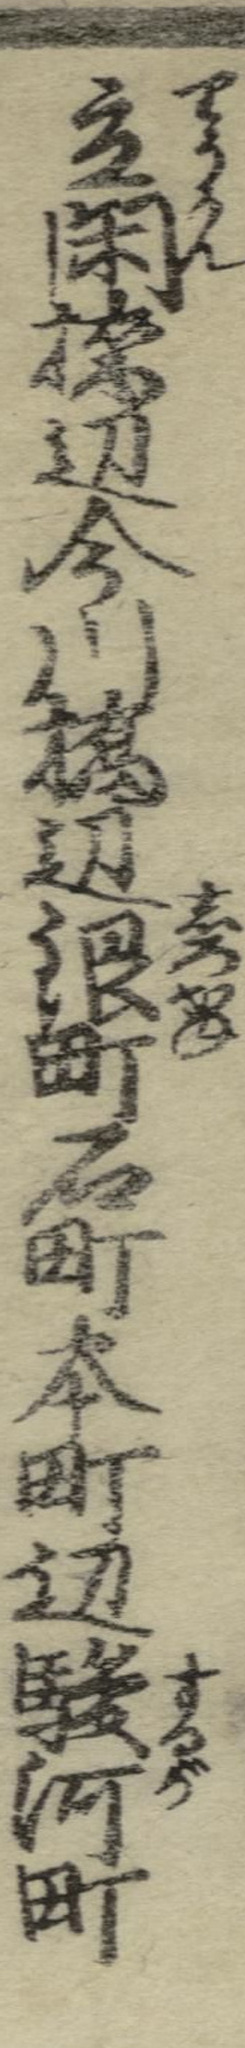立閑橋辺今川橋辺銀町石町本町辺駿河町
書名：[文政十二年三月の江戸大火に関する瓦版]
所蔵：東京大学地震研究所図書室 Earthquake Research Institute Library, The University of Tokyo, JAPAN
